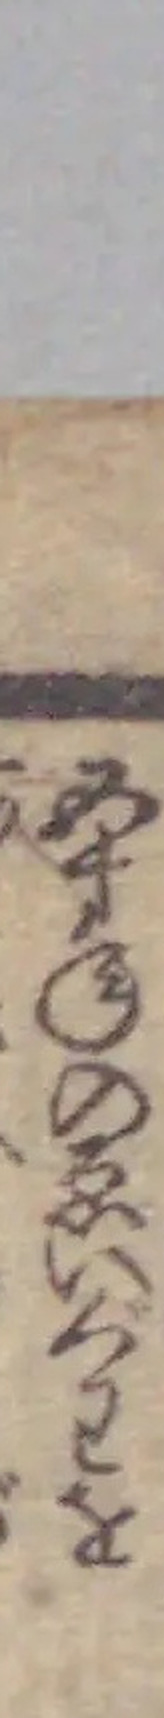五十年のゑいぐわを
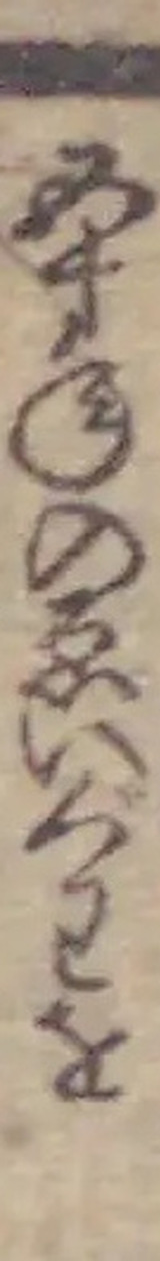五十年のゑいぐわを
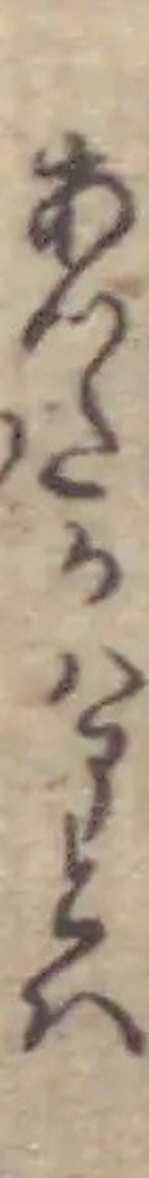あつたかハァとは
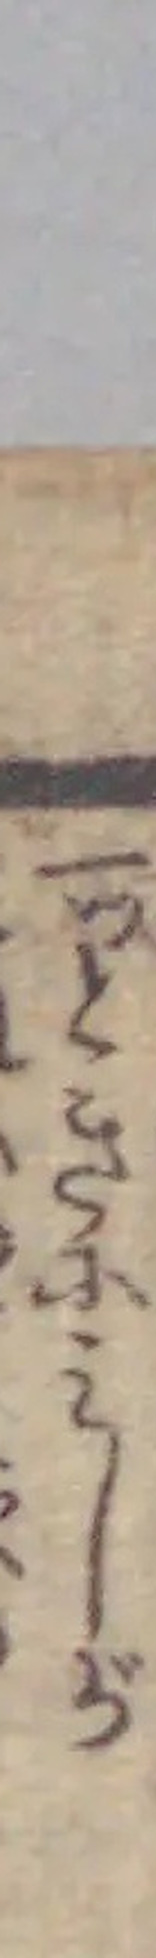一ツときにみしが
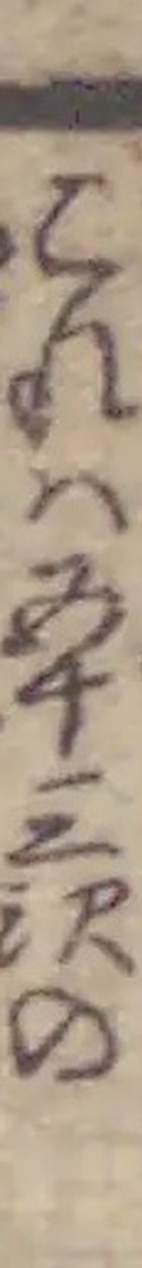これは五十三次の
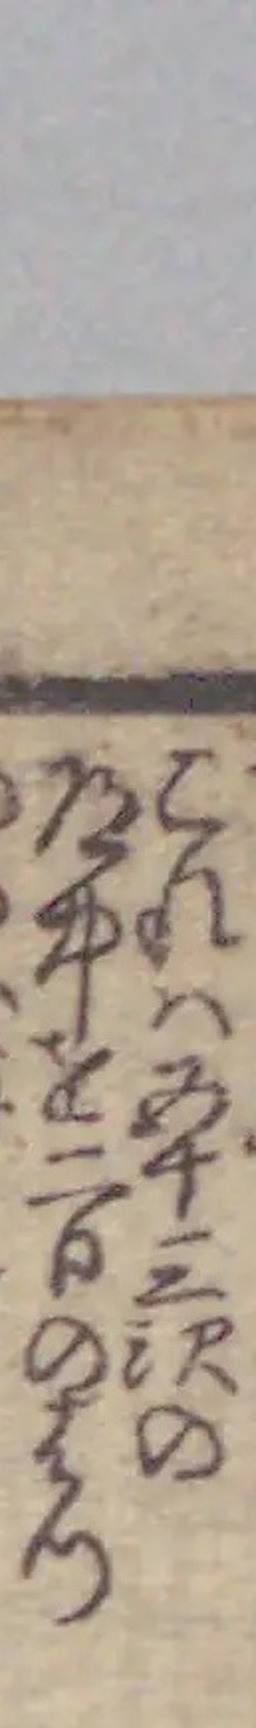道中を二日のはつ
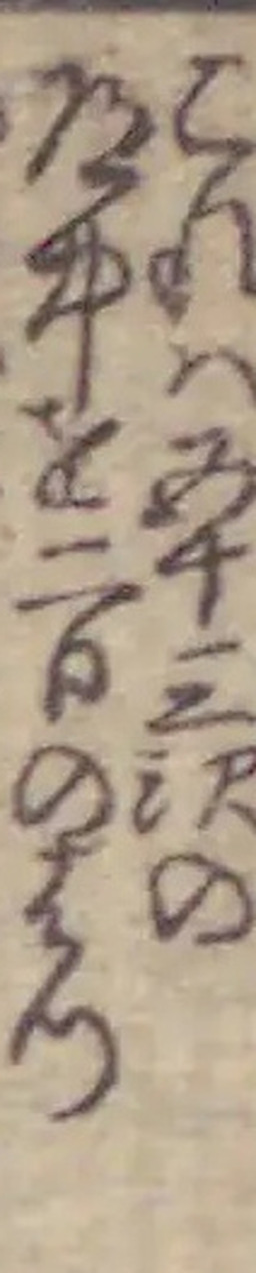道中を二日のはつ
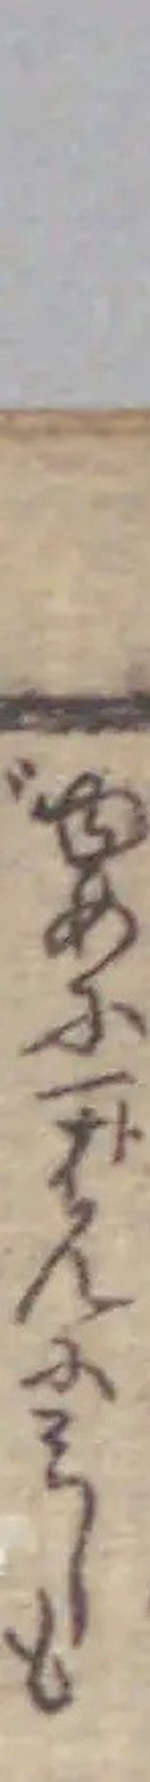ゆめに一トはんにみしも
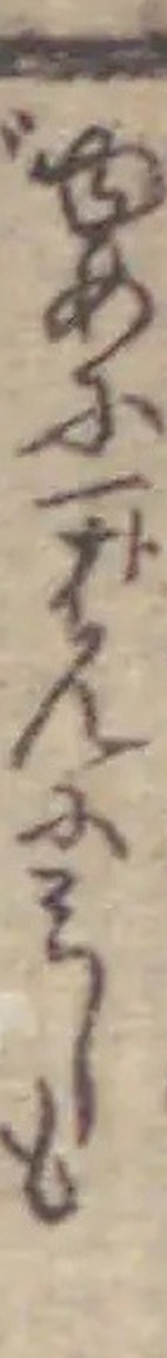ゆめに一トはんにみしも
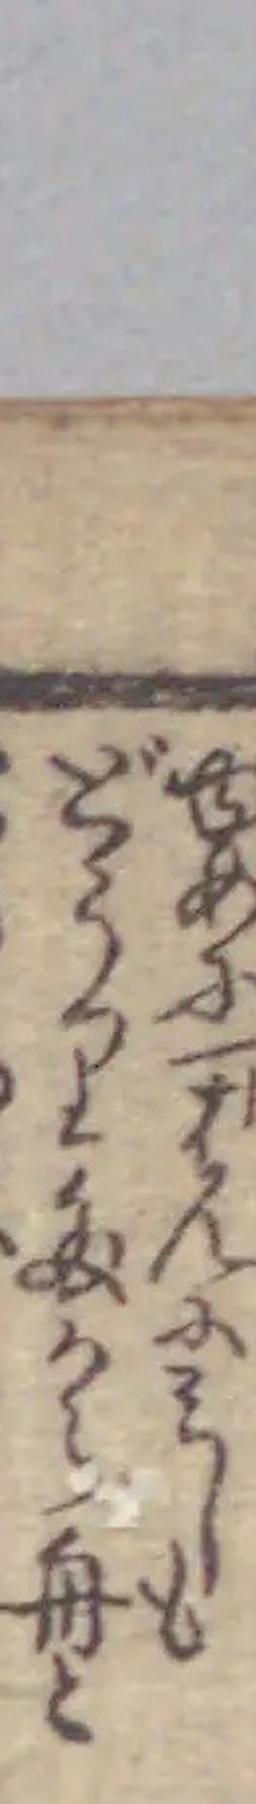どうりたから舟と
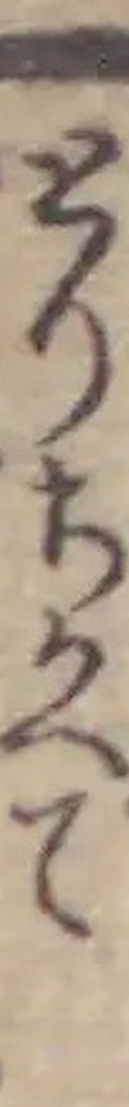とりちかへて
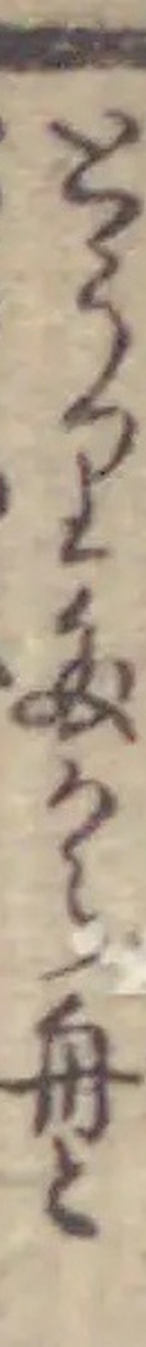どうりたから舟と
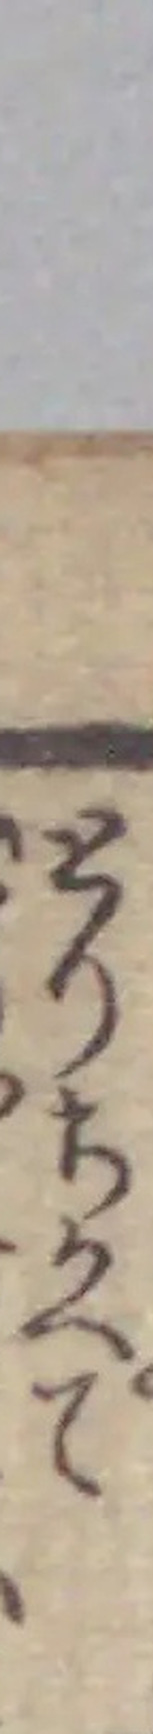とりちかへて
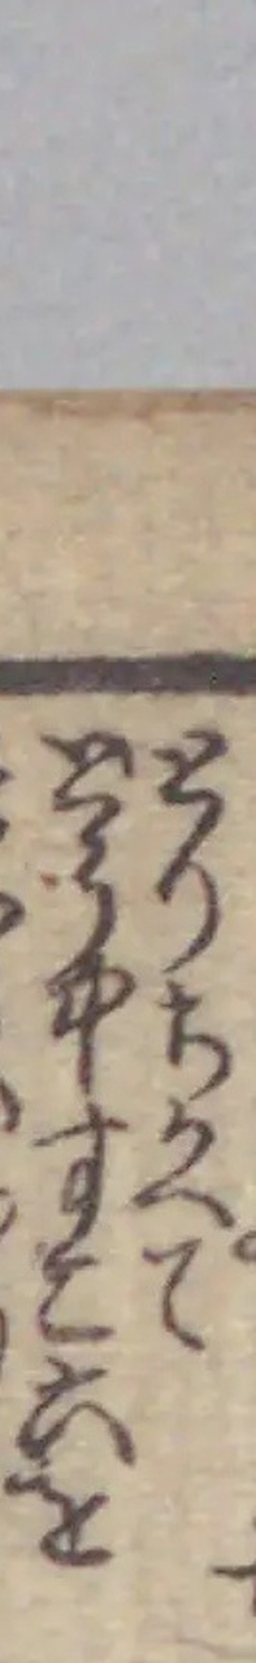とう中すこ六を
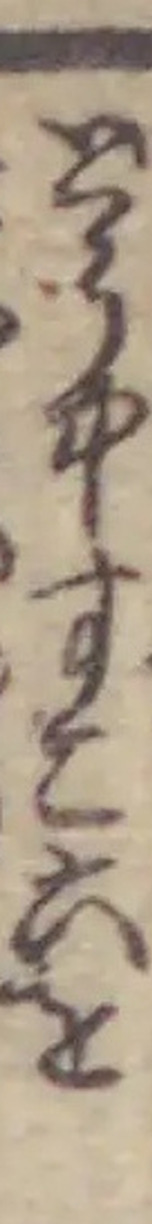とう中すこ六を
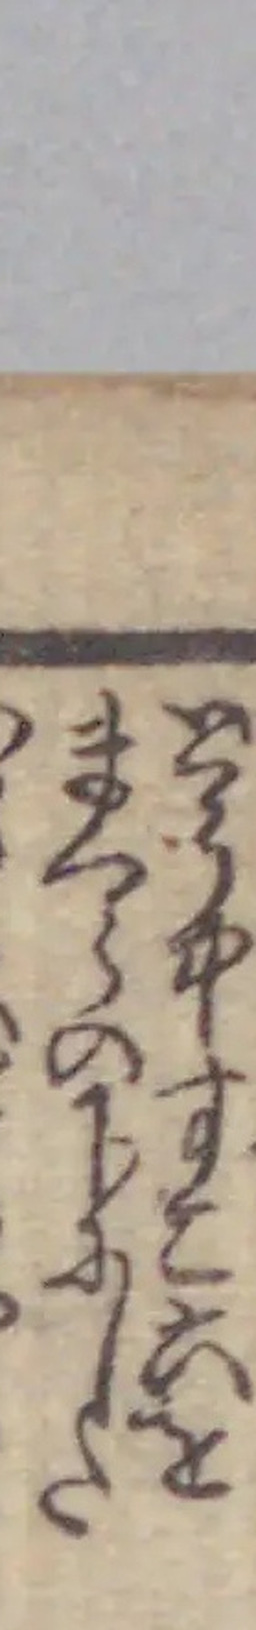まくらの下にした
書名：道笑双六
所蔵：国立国会図書館 National Diet Library, JAPAN
